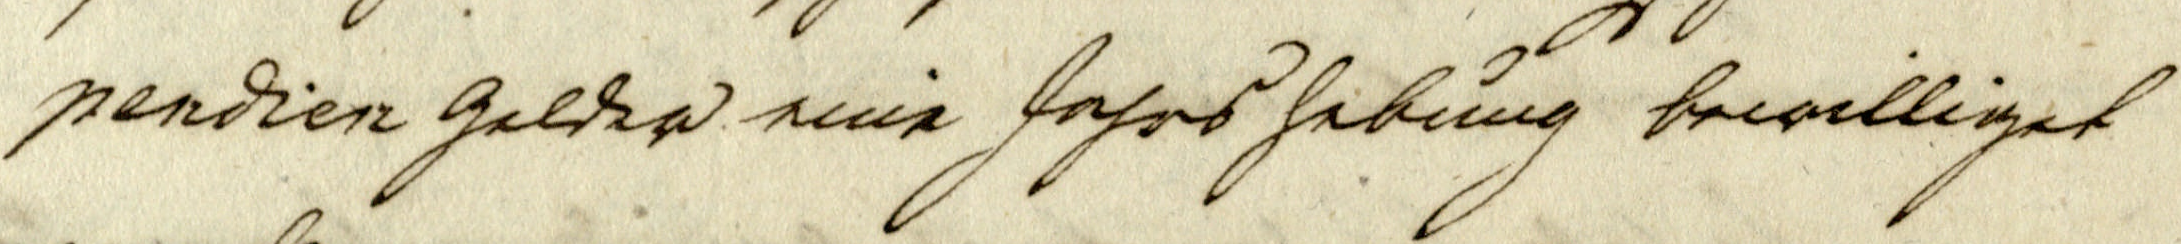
pendien Gelder eine Jahreshebung bewilliget
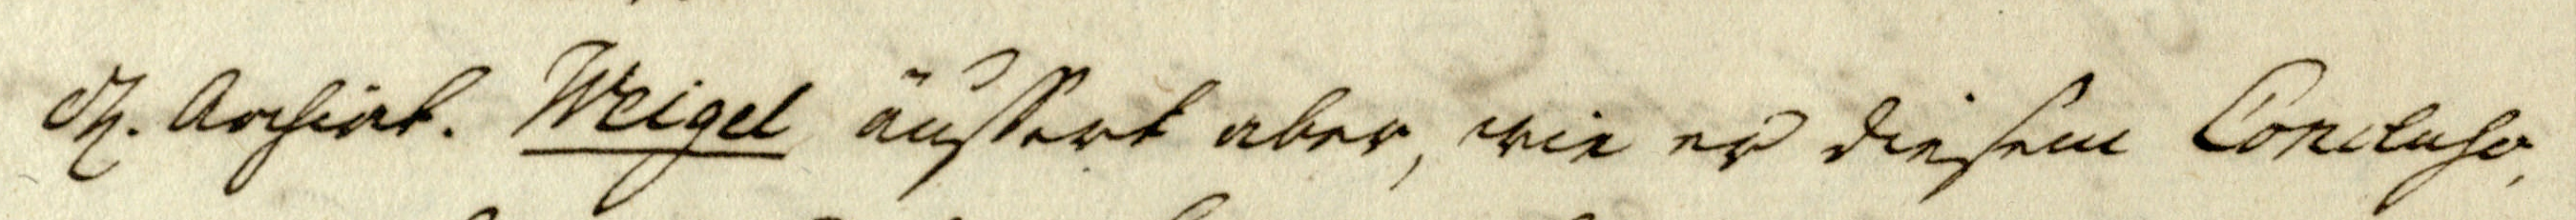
dh. Archiat. Weigel äussert aber, wie er diesem Concluso,
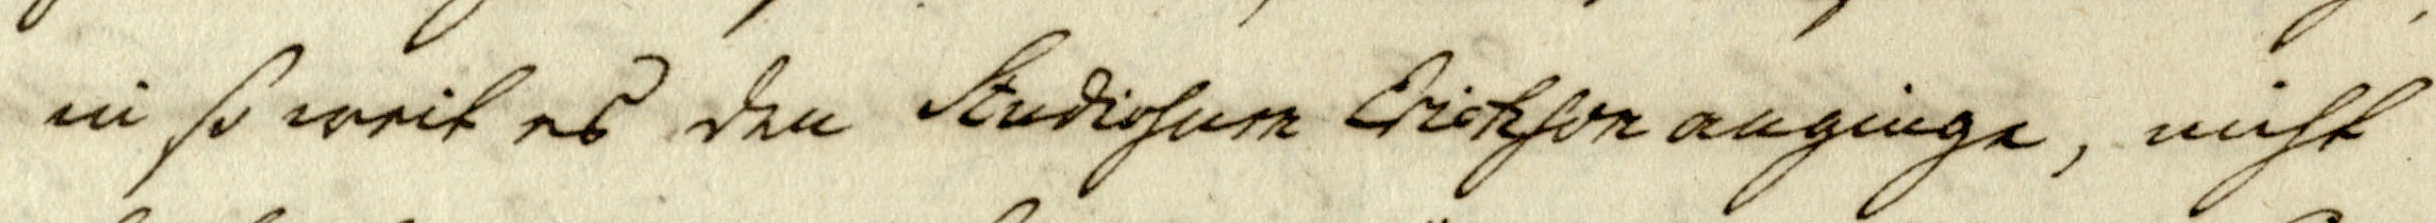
in so weit es den Studiosum Erichson anginge, nicht
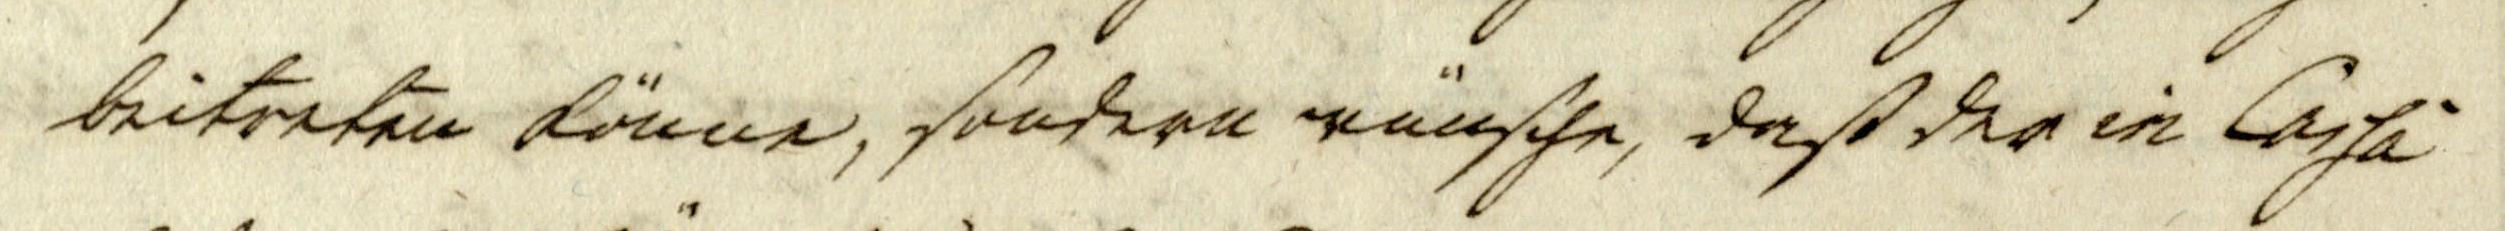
beitreten könne, sondern wünsche, daß der in Cassa
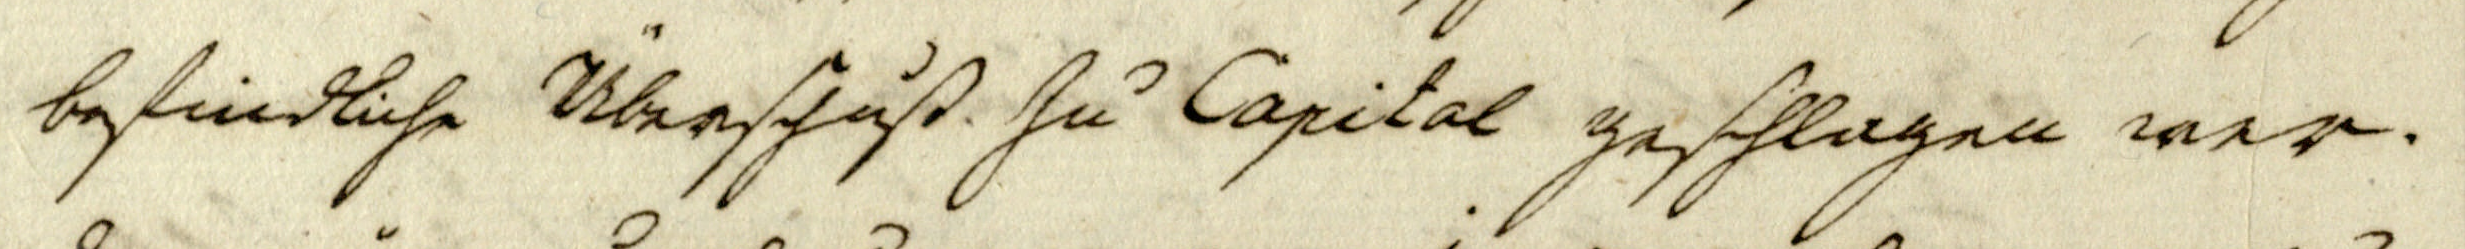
befindliche Überschuß zu Capital geschlagen wer¬
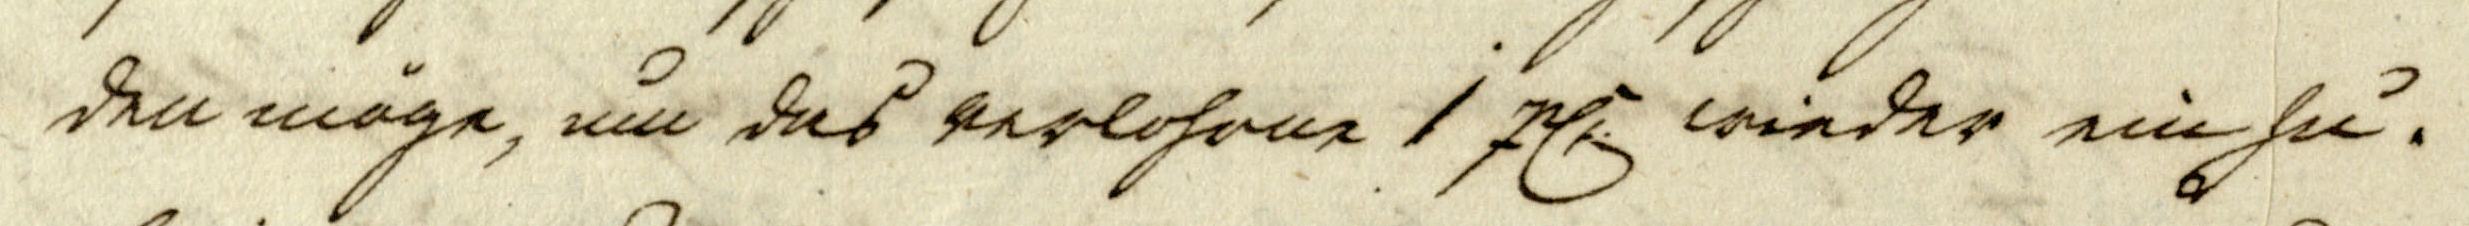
den möge, um das verlohrene 17 l. wieder einzu¬
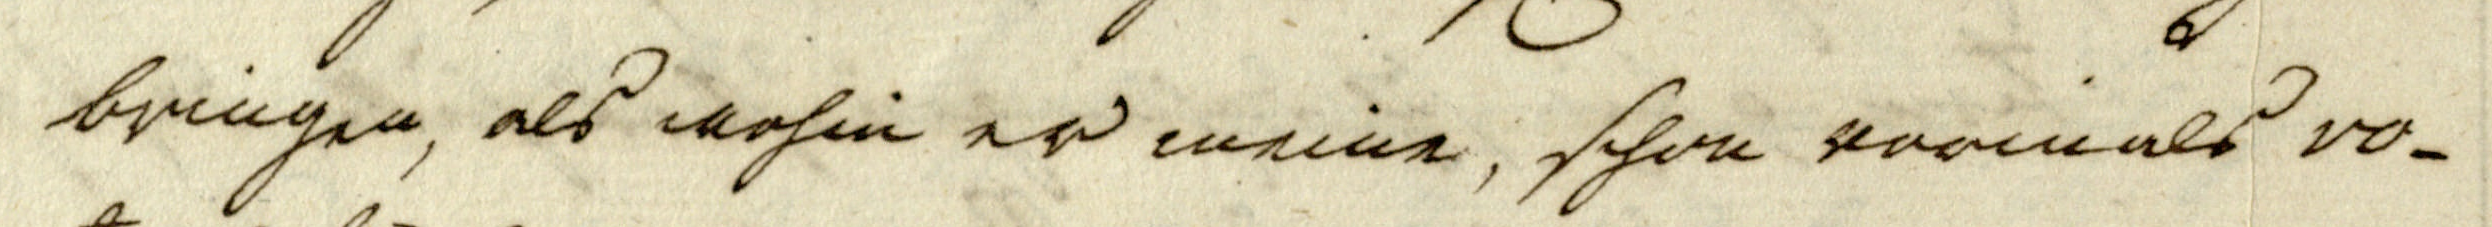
bringen, als wohin er meine, schon vormals vo¬
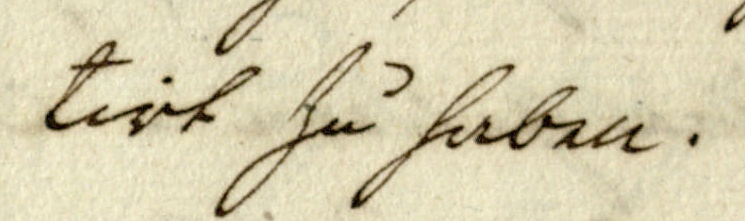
tirt zu haben.
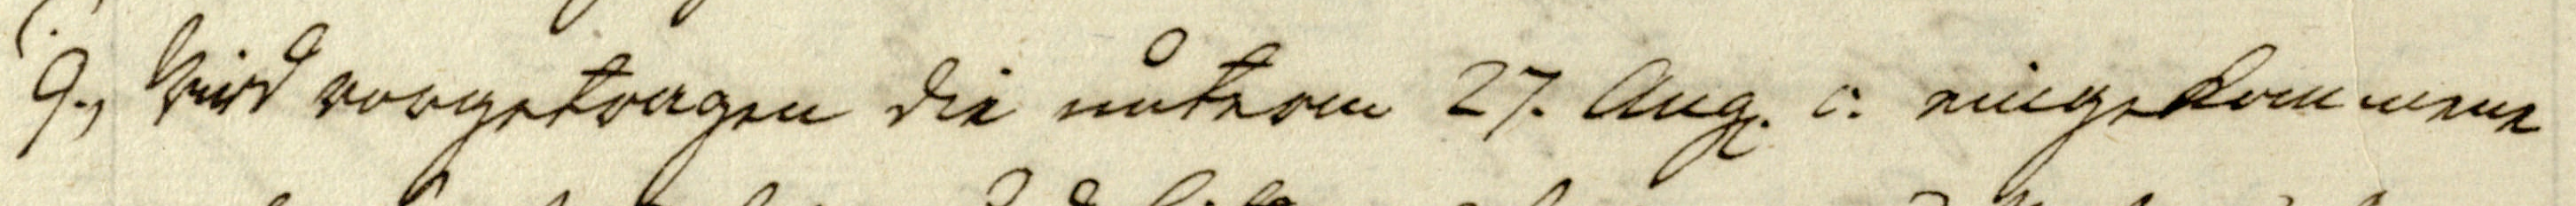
9., Wird vorgetragen die unterm 27. Aug. c. eingekommene
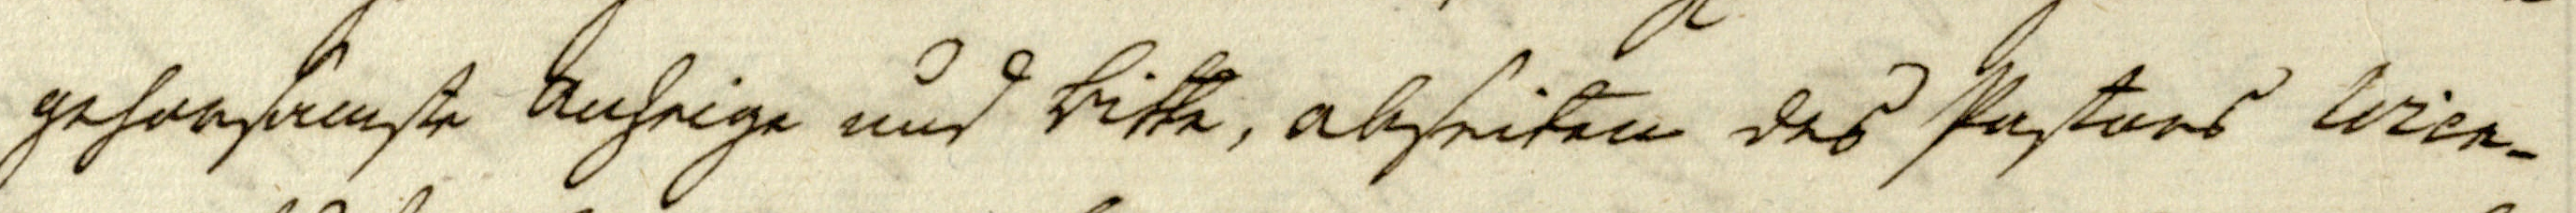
gehorsamte Anzeige und Bitte, abseiten des Pastors Wien¬
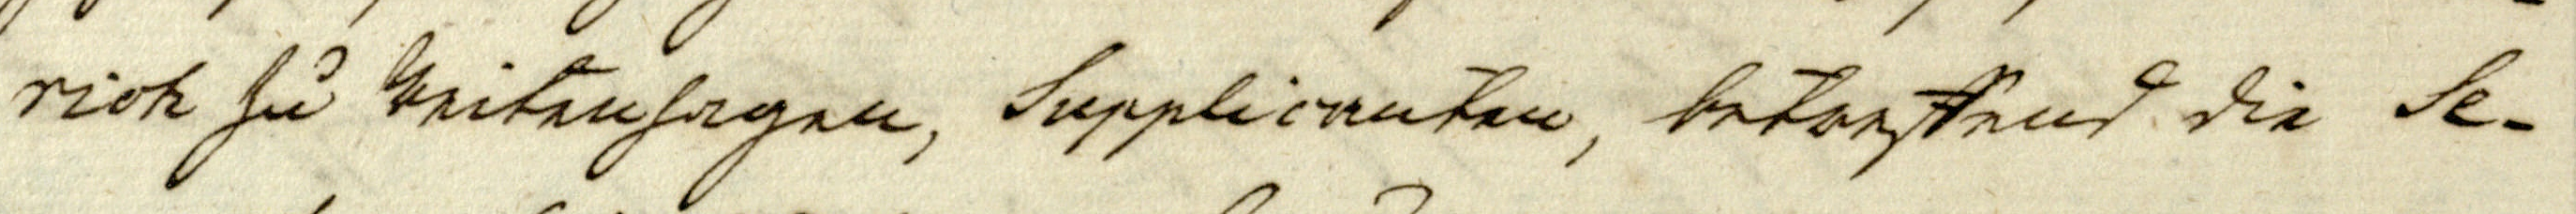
rich zu Weitenhagen, Supplicanten, betreffend die Se¬
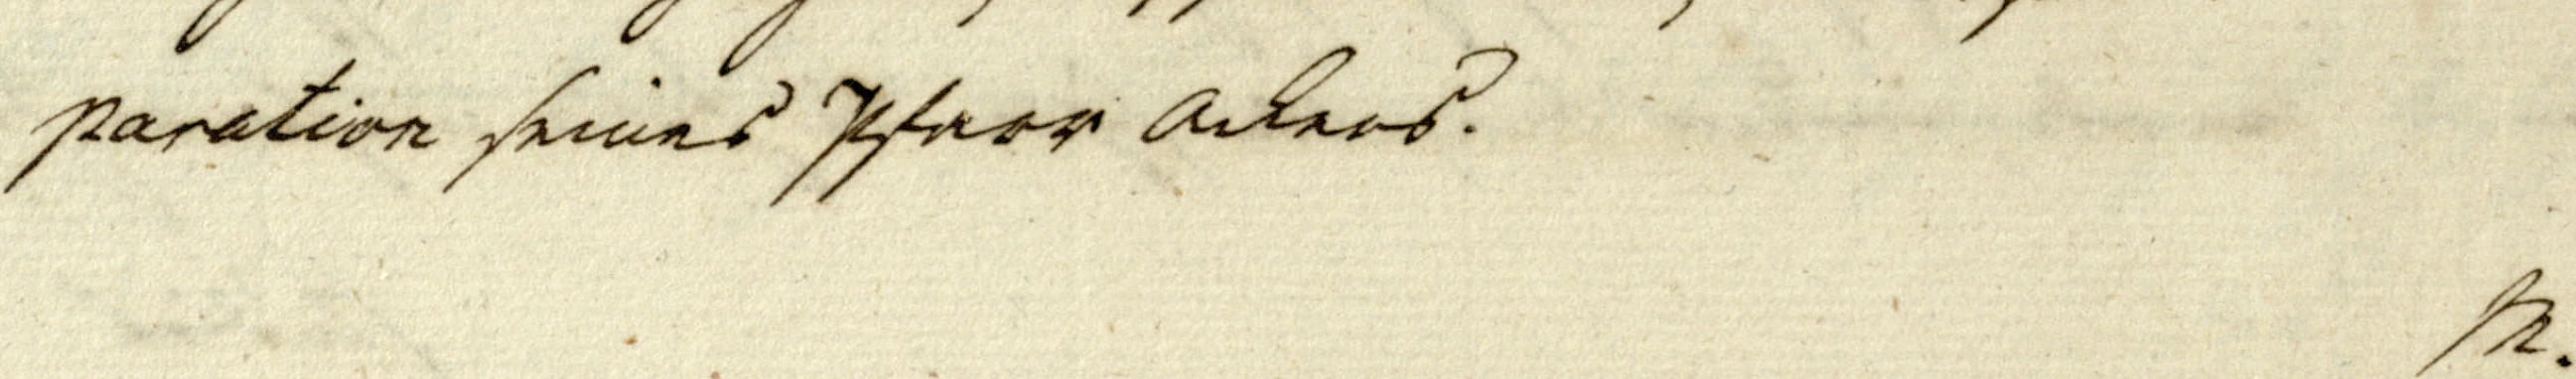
paration seines Pfarr Ackers.
